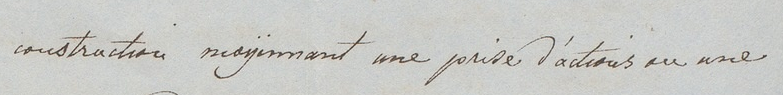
construction moyennant une prise d'actions ou une
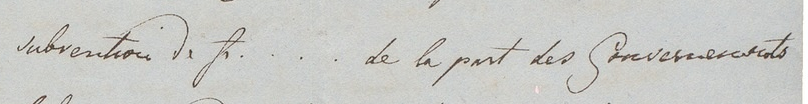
subvention de fr.... de la part des Gouvernements
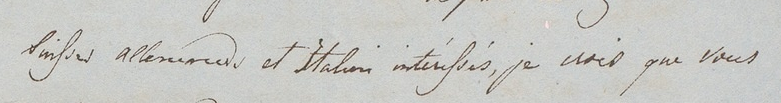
Suisses Allemands et Italien intéressés, je crois que Vous
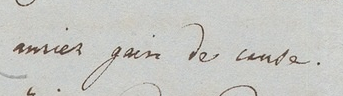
auriez gain de cause.
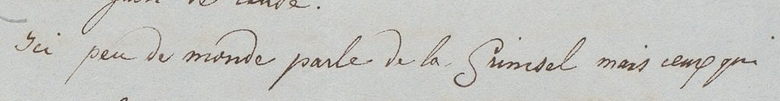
Ici peu de monde parle de la Grimsel mais ceux qui
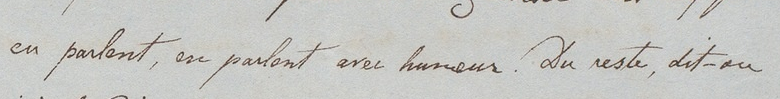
en parlent, en parlant avec humeur. Du reste, dit-on
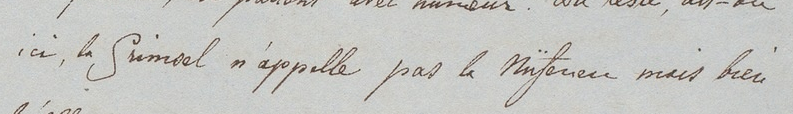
ici, la Grimsel n'appelle pas le Nüfenen mais bien
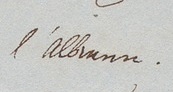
l'Albrunn.
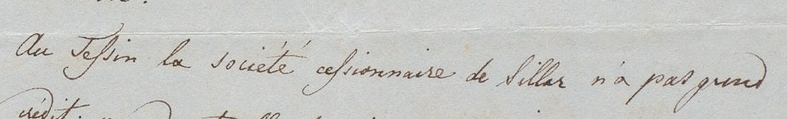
Au Tessin la société cessionnaire de Sillar n'a pas grand
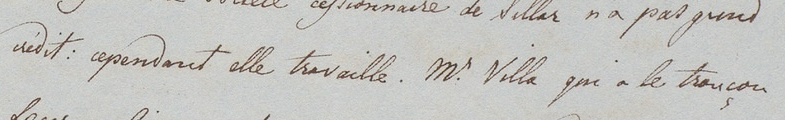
crédit: cependant elle travaille. MrVilla qui a le tronçon
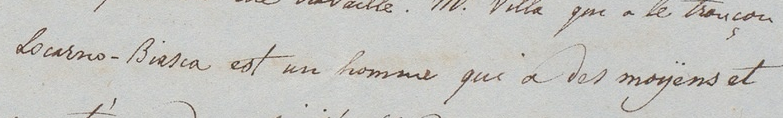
Locarno–Biasca est un homme qui a des moyens et
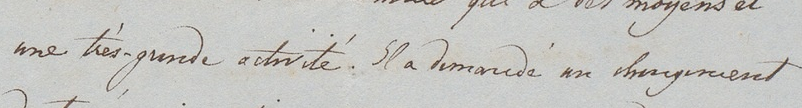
une très-grande activité. Il a demandé un changement
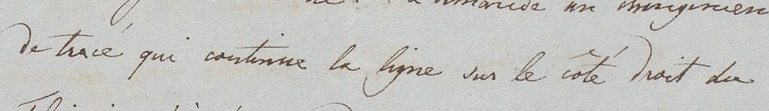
de tracé qui continue la ligne sur le côté droit du
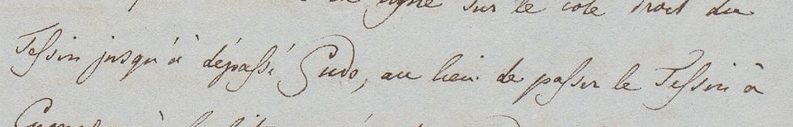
Tessin jusqu'à dépassé Gudo, au lieu de passer le Tessin à
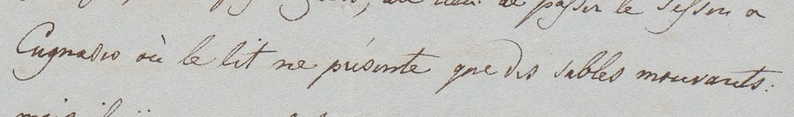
Cugnasco où le lit ne présente que des sables mouvants:
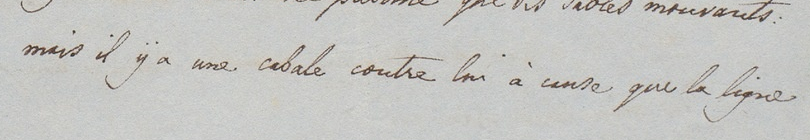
mais il y a une cabale contre lui à cause que la ligne
